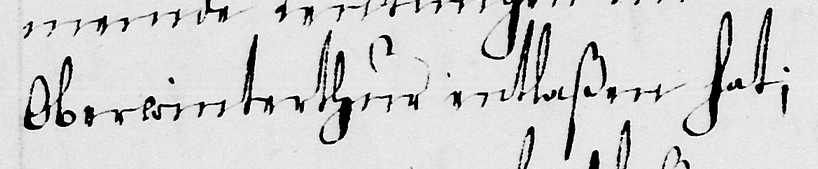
Oberwinterthur entlaßen hat;
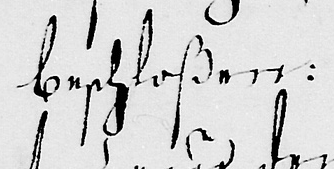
beschloßen:
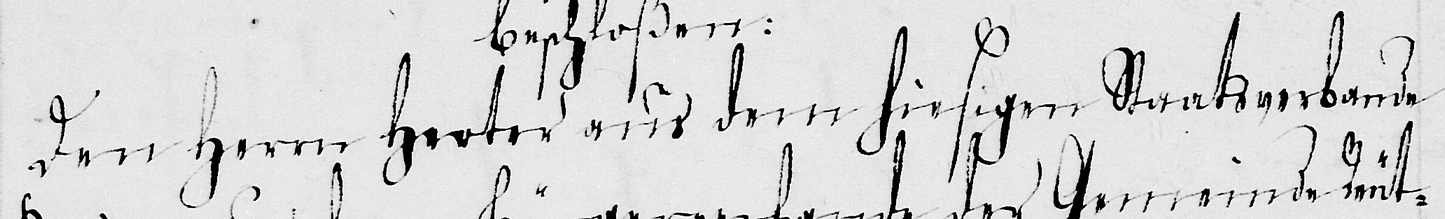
Den Herrn Herter aus dem hiesigen Staatsverbande
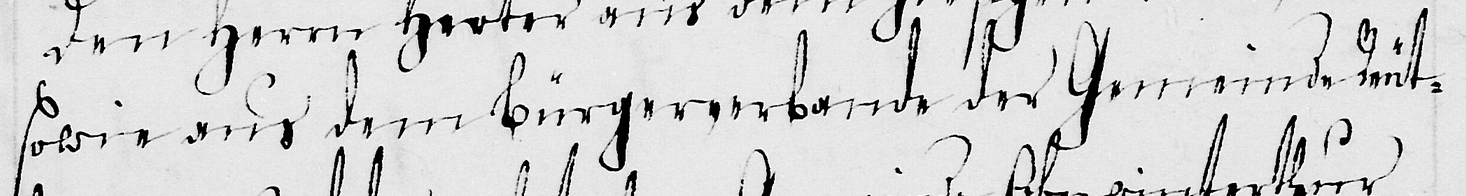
sowie aus dem Bürgerverbande der Gemeinde Reut¬
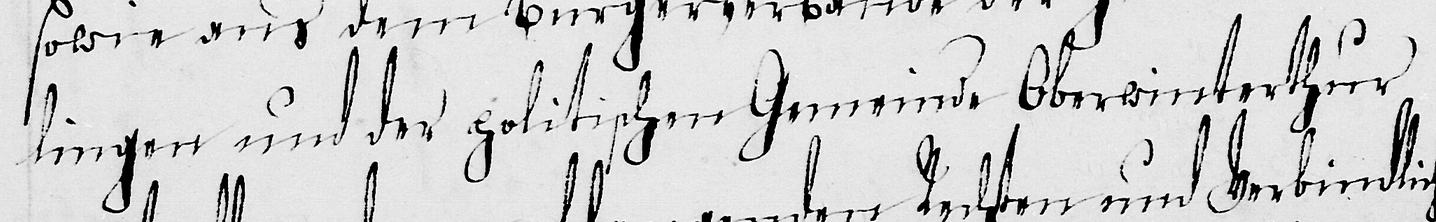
lingen und der politischen Gemeinde Oberwinterthur
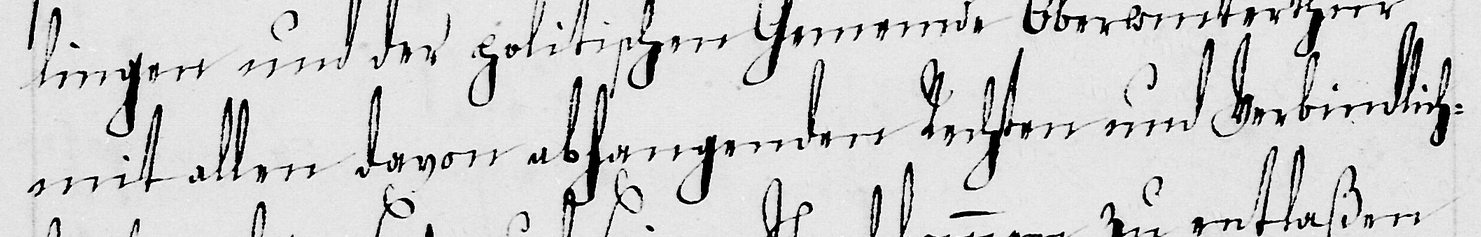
mit allen davon abhangenden Rechten und Verbindlich¬
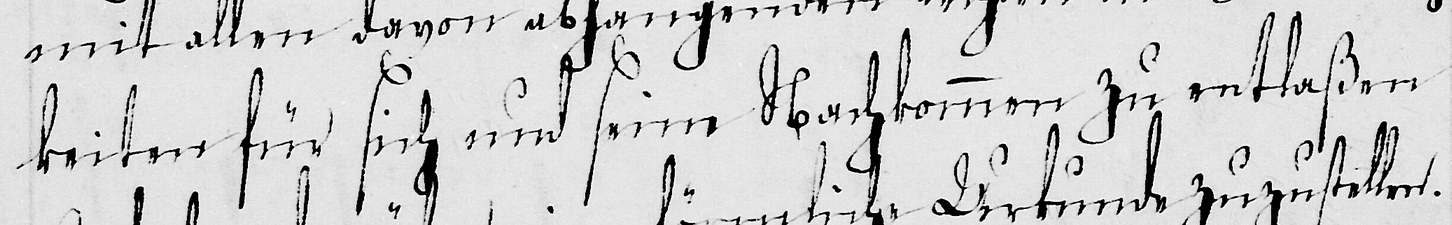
keiten für sich und seine Nachkommen zu entlaßen
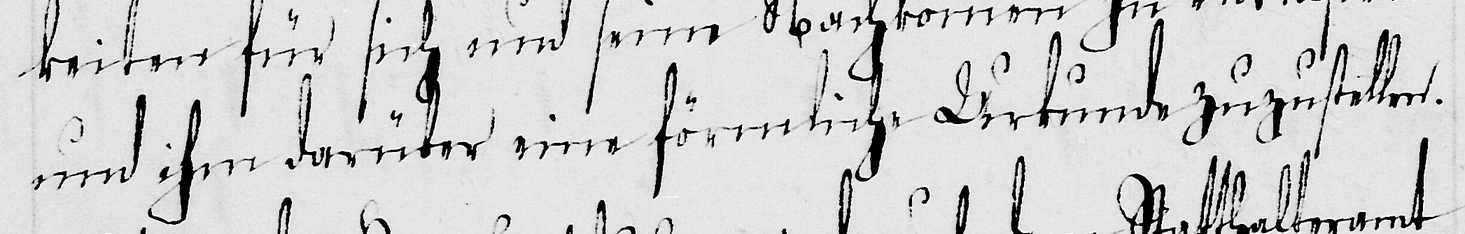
und ihm darüber eine förmliche Urkunde zuzustelle¬
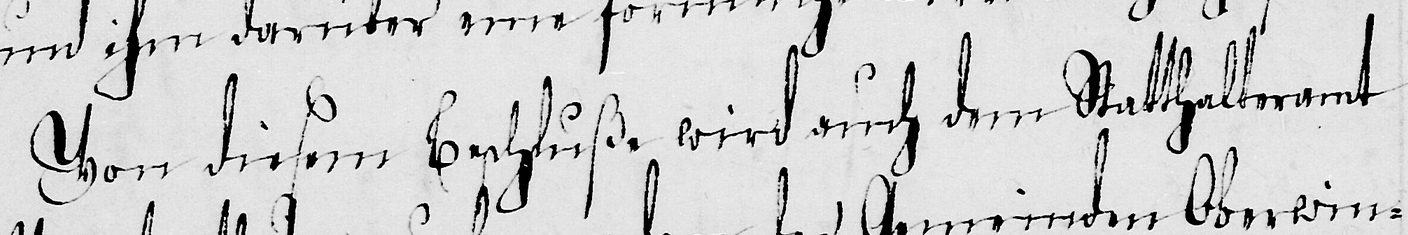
Von diesem Beschluße wird auch dem Statthalteramt
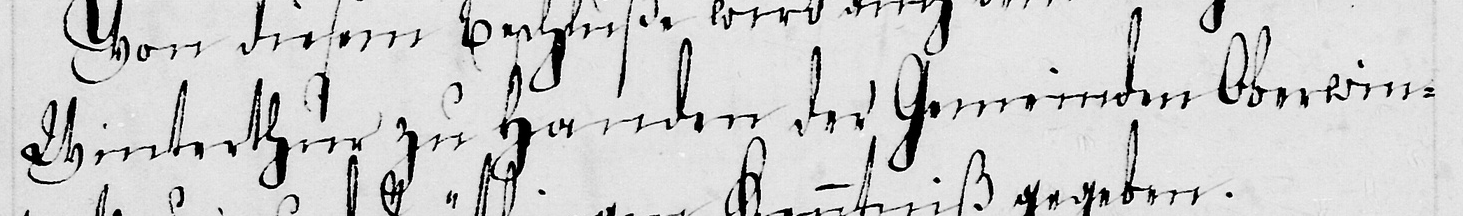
Winterthur zu Handen der Gemeinde Oberwin¬
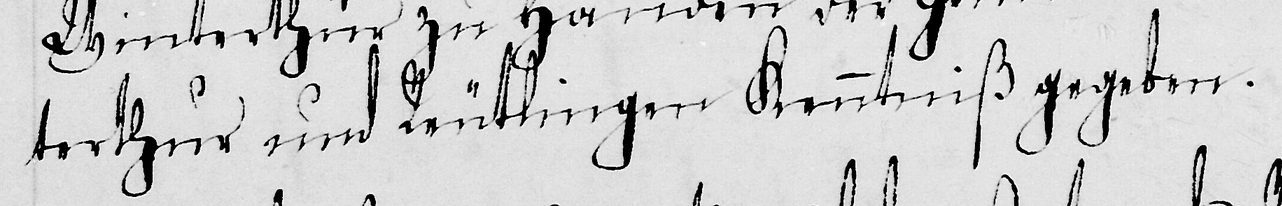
terthur und Reutlingen Kenntniß gegeben.
